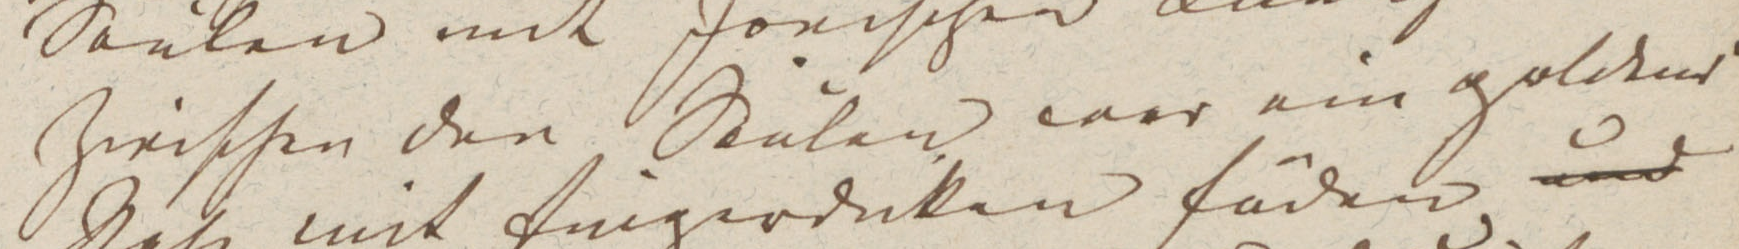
Zwischen den Säulen war ein goldens
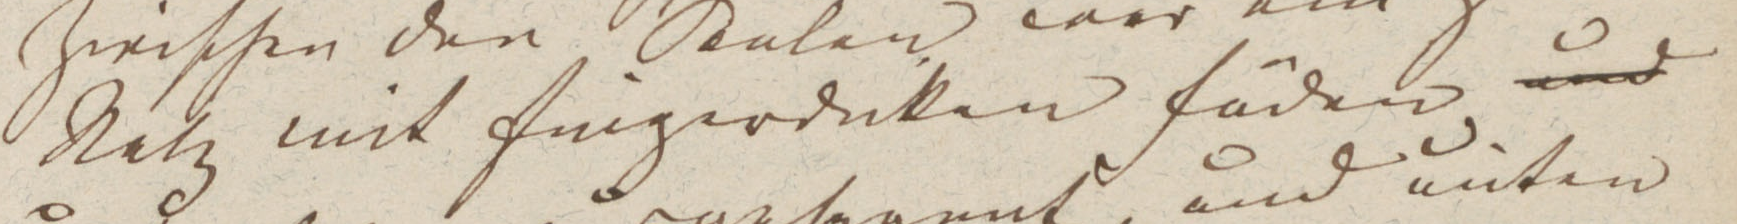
Netz mit fingerdicken Fäden und
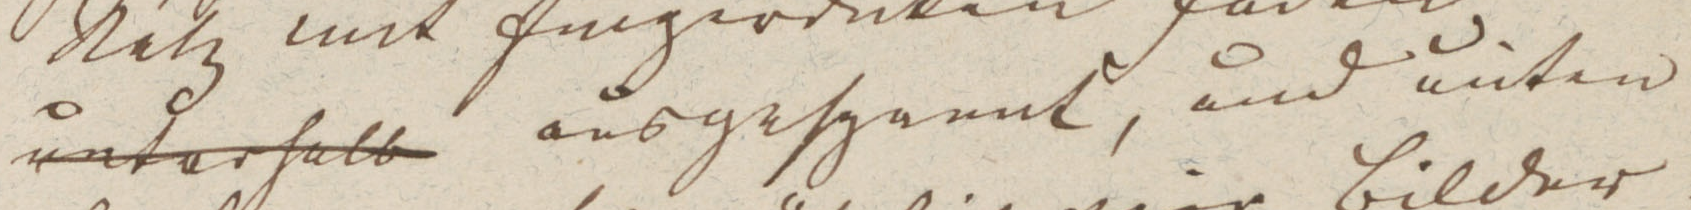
unterhalb ausgespannt, und unten
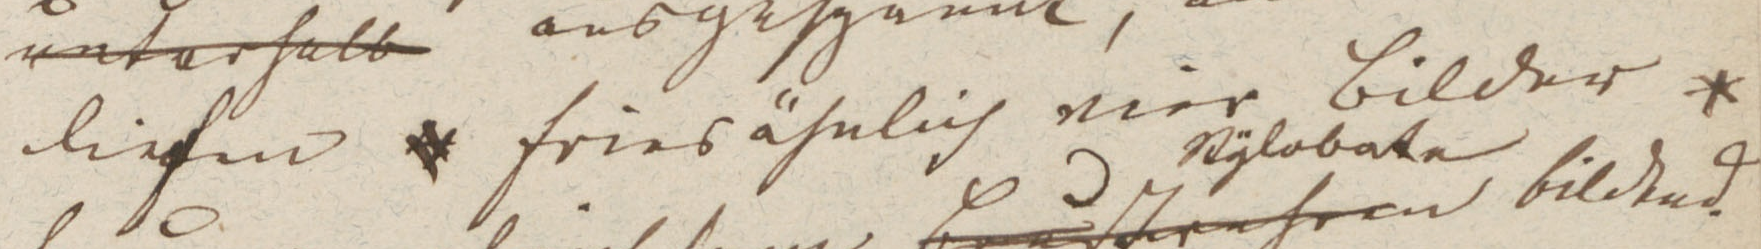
lieen 4 friesähnlich vier Bilder
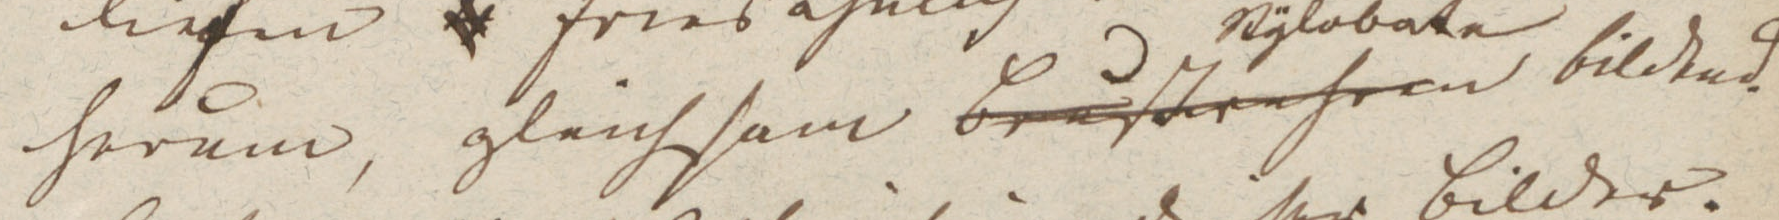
herum, gleichsam Brust Stylobate bildend. %
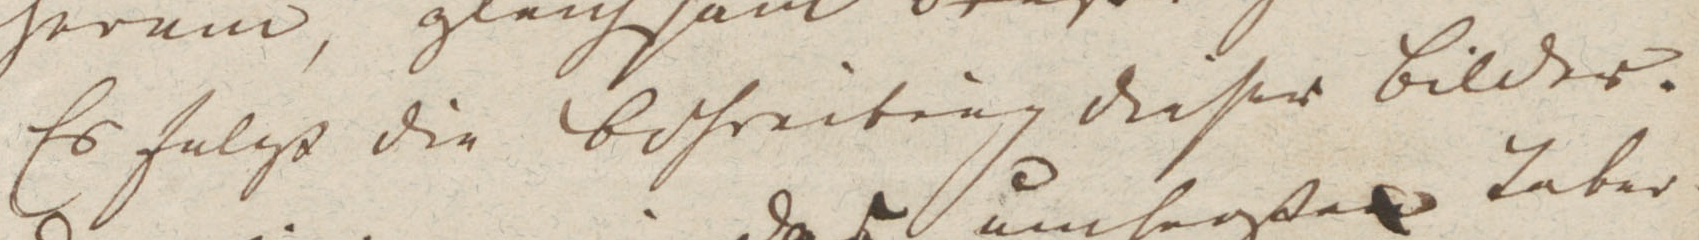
Es folgt die Beschreibung dieser Bilder.
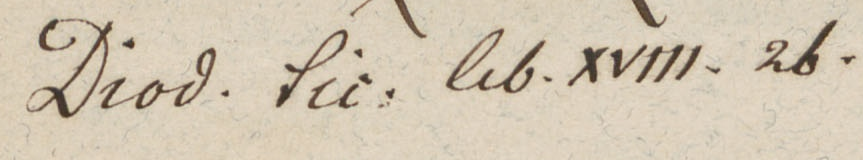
Diod. Sic. lib. XVIII. 26.
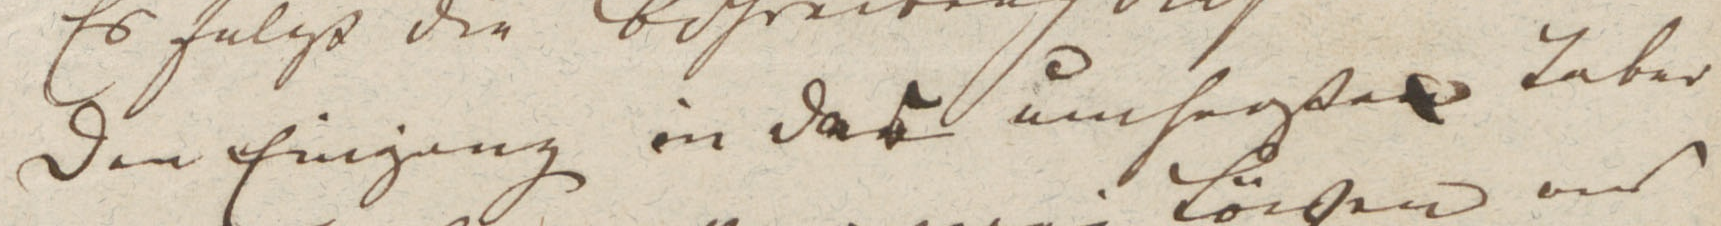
Den Eingang in deras umhegten Taber-
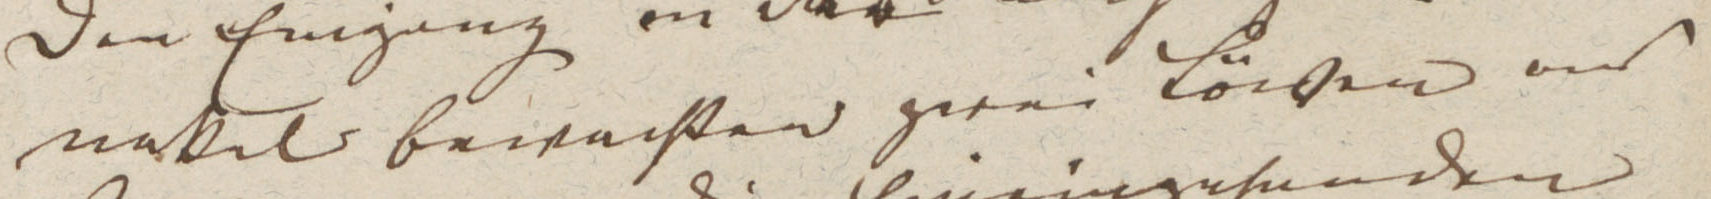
nakel bewachten zwie Löwen aus
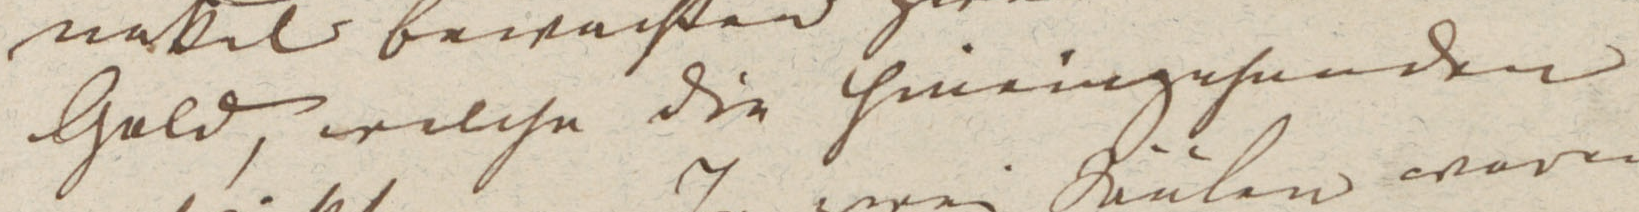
Gold, welche die Hineingehenden
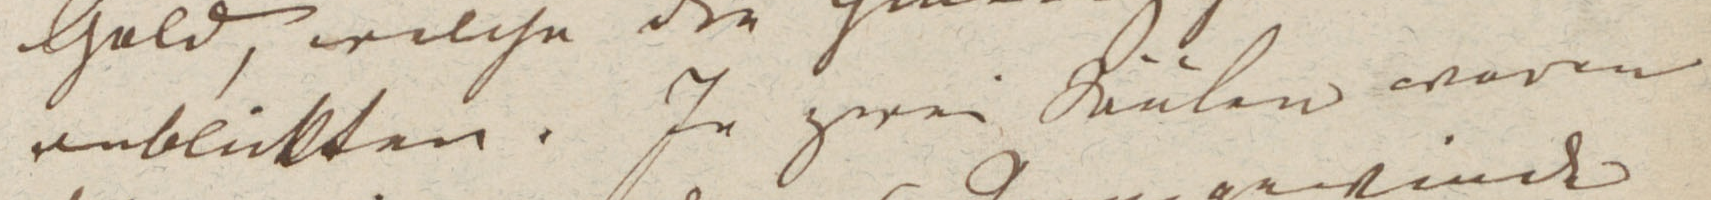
anblickten. Je zwei Säulen waren
